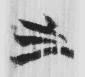之
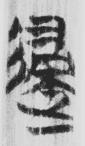{辶帚}
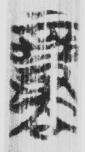商
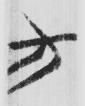方
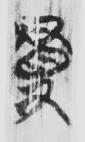曼
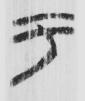于
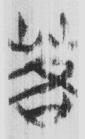茖
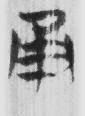甬
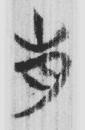{屮月}
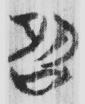卲
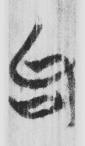句
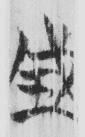城
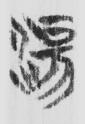湯
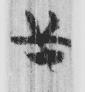弋
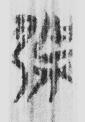傑
